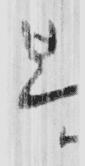也
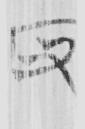反
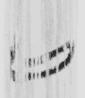㠯（以）
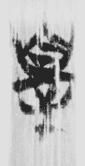辠
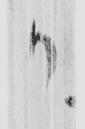人
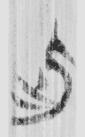此
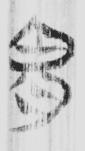胃
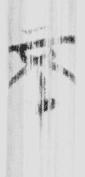不
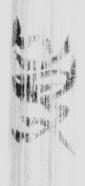事
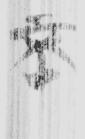不
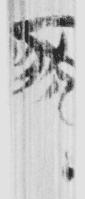戾
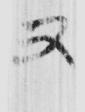又
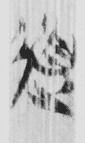道
